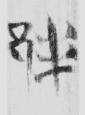邦
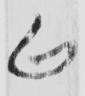㠯（以）
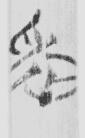卒B
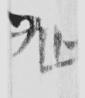喪
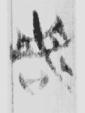若
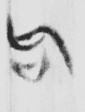句
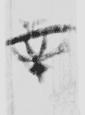辛
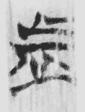者
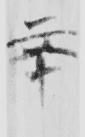不
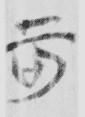可
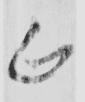㠯（以）
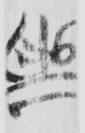爲
